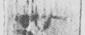廿
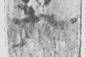九
